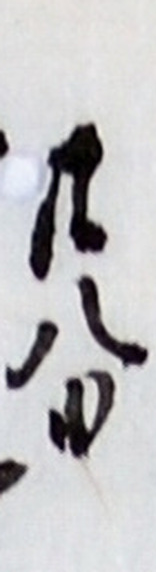廿八日
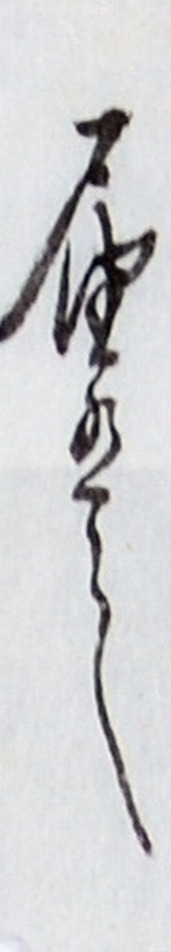届有之
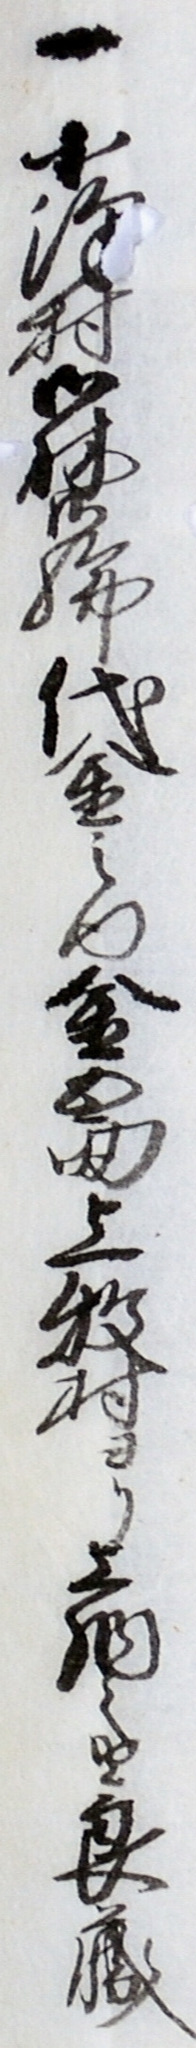一小澤村御林御払代金之内金五両上牧村ヨリ上納之由良蔵
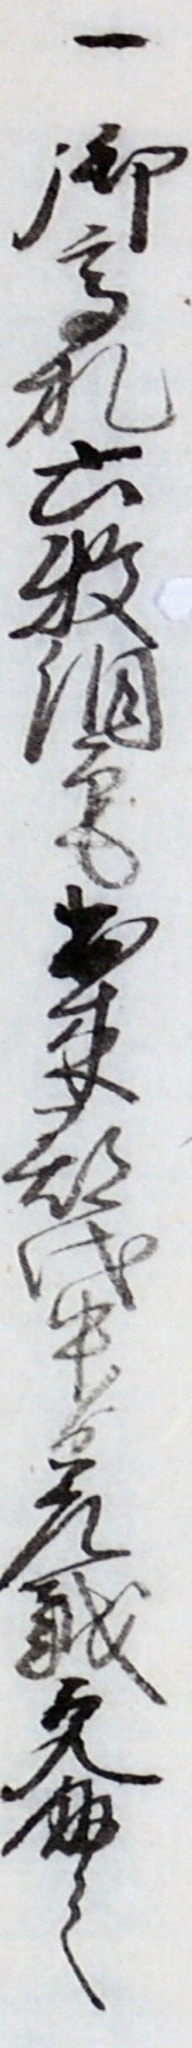一御高札六枚調印も出来郡代中ゟ差越受取之
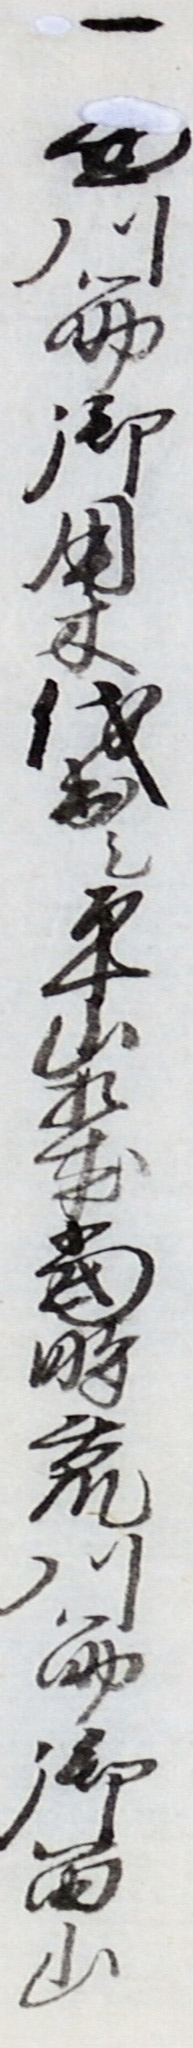一細川筋御用木伐出し平山相成当時荒川筋御留山
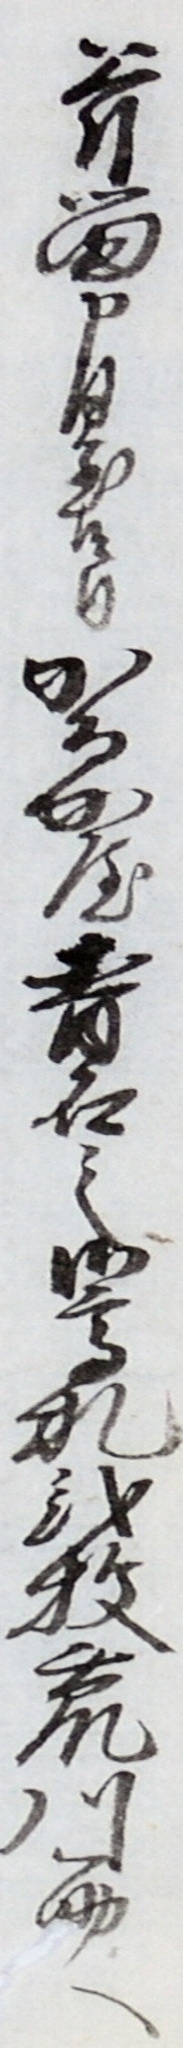肴留申付置候付駕籠屋青石之御高札弐枚荒川筋へ
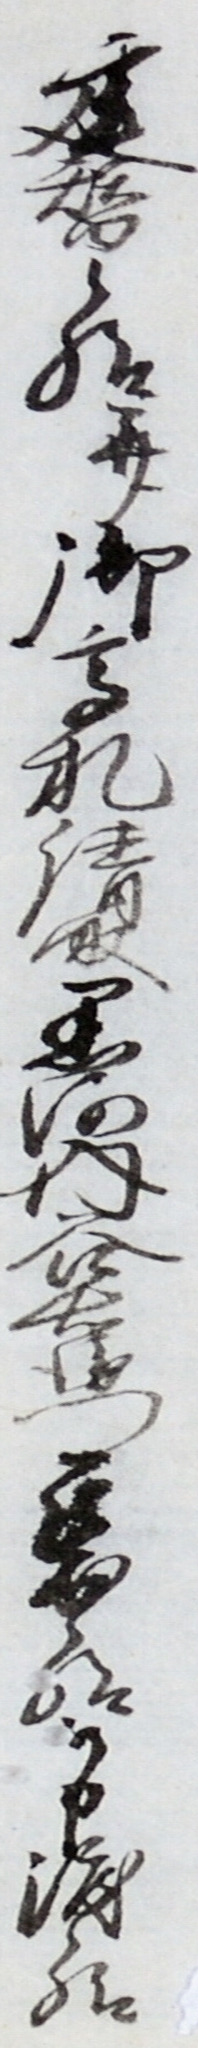一建替候様并御高札請取黒河内藤右衛門罷出候様被申渡候様
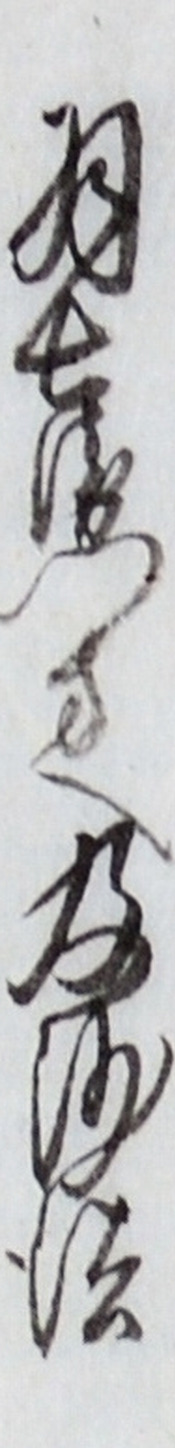羽右衛門方へ及沙法
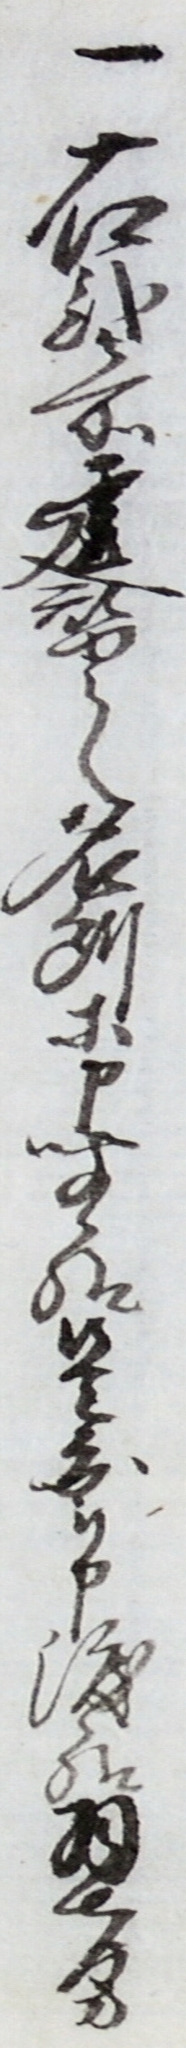一右弐ヶ所建替之名所等申聞候様是亦被申羽右衛門右衛門
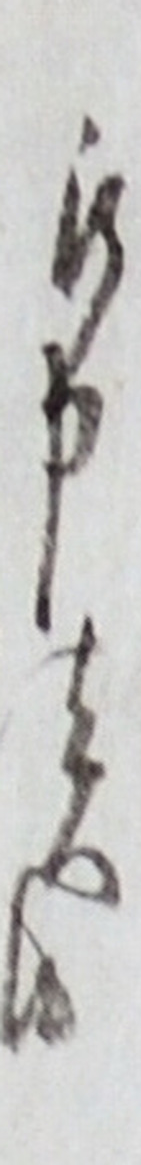被申談候

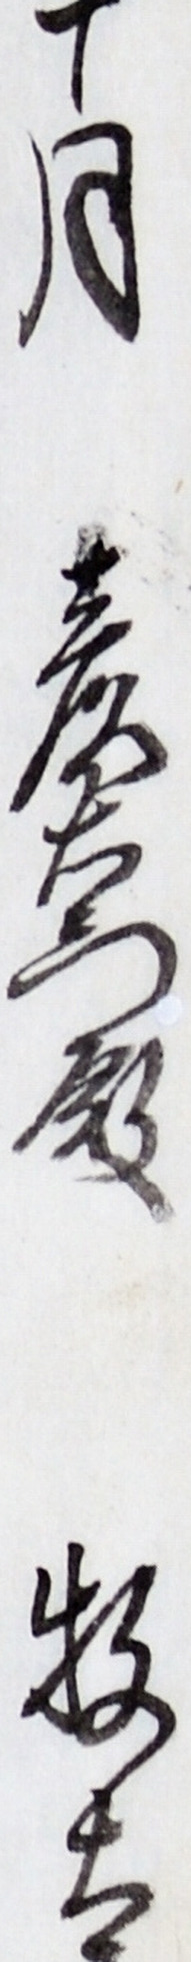十月彦右衛門殿牧太
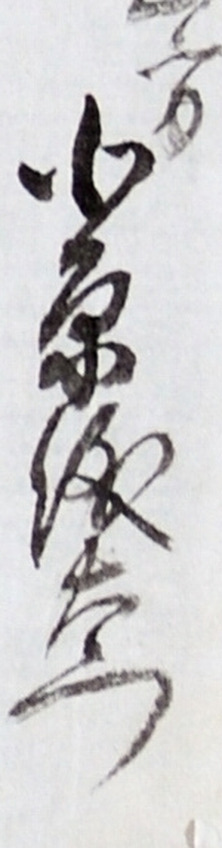北原儀右衛門
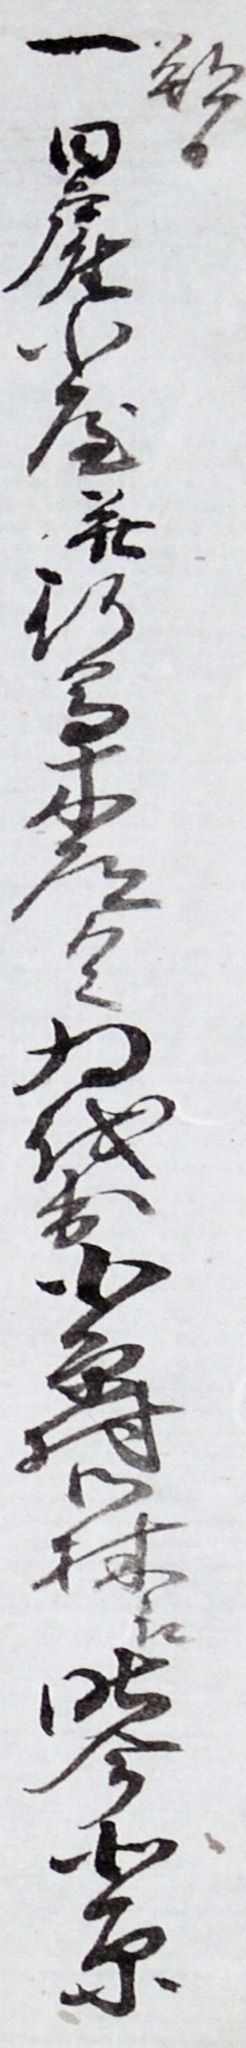一日雇小屋并行馬木道具為伐出小原村御林江昨今北原
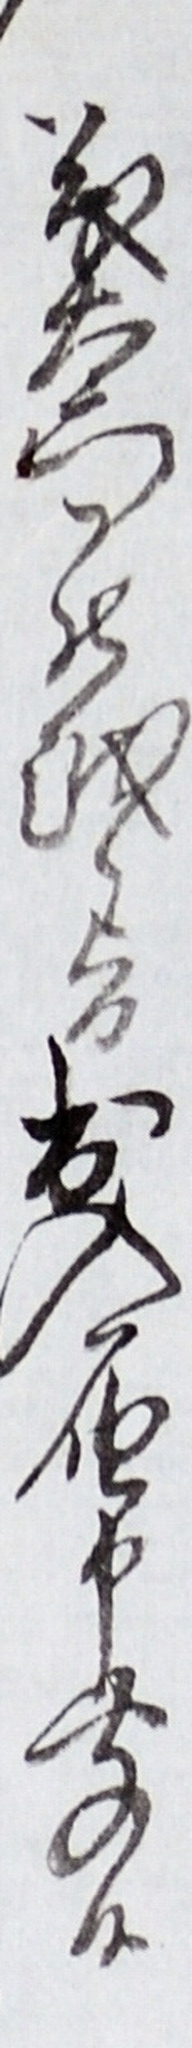義右衛門罷越候旨出入届申聞候
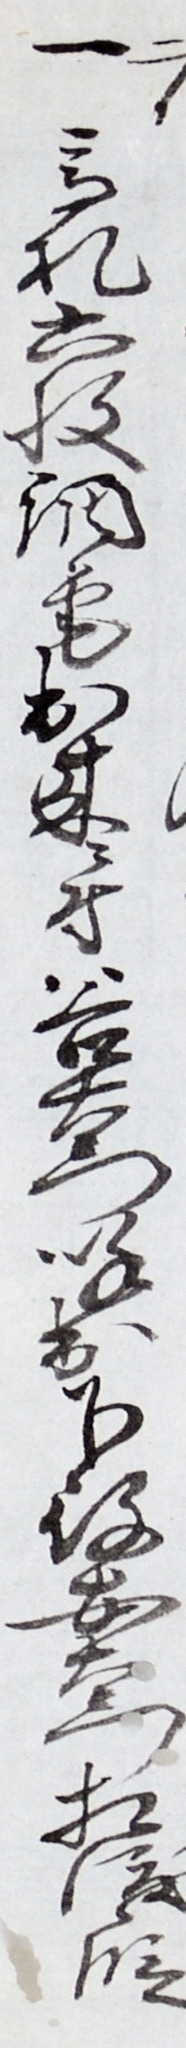一高札六枚納雪出来ニ付善右衛門呼出下役安右衛門相渡候段
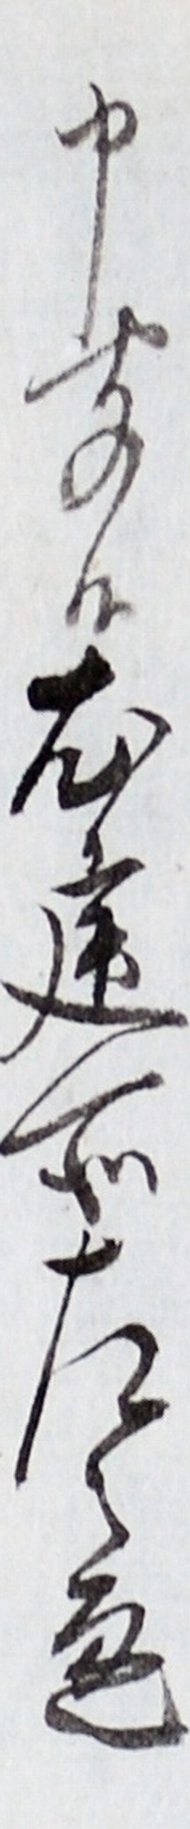申聞候尤建所左之通
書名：御山奉行御用控
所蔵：伊那市立高遠町図書館・合同会社AMANE
